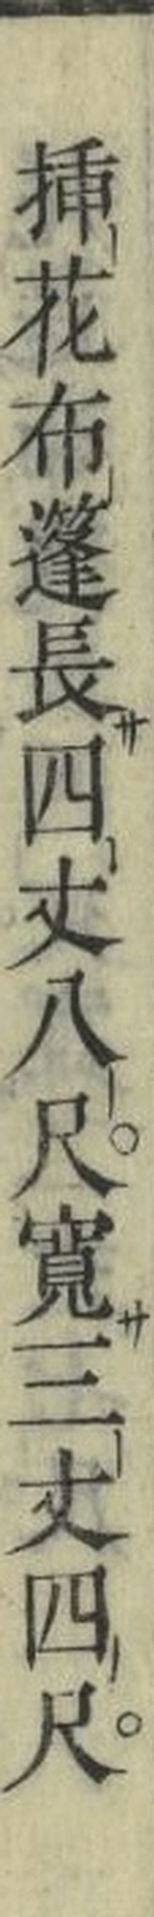挿-花布-篷長四-丈八-尺。寬三-丈四-尺。

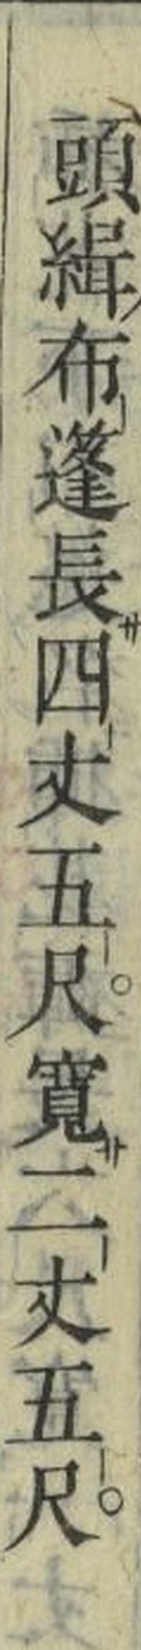頭-緝布-篷長四-丈五-尺。寬二-丈五-尺。
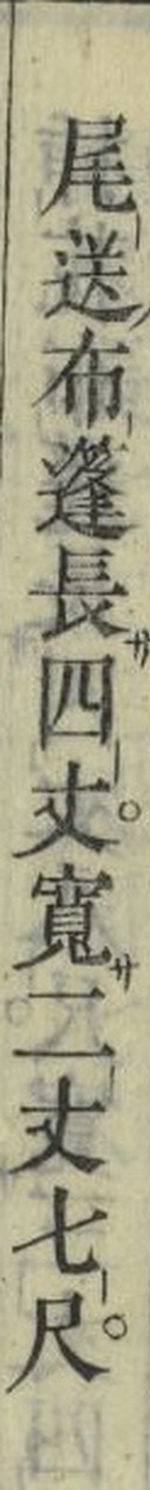尾-送布-篷長四-丈。寬二-丈七-尺。
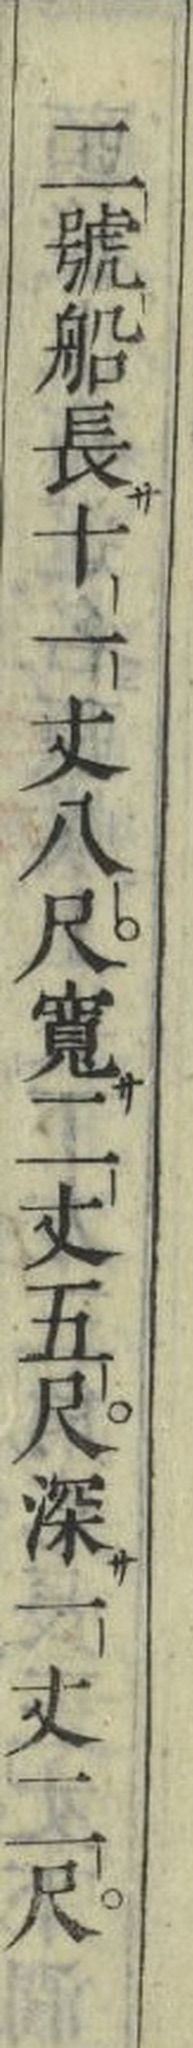二-號-船長十-一-丈八-尺。寬二-丈五-尺。深一-丈二-尺。
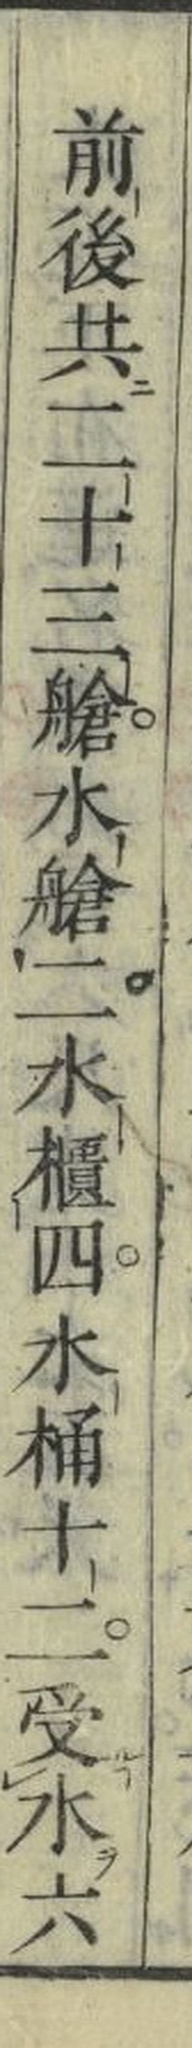前-後共二-十-三-艙。水-艙二。水-櫃-四。水-桶十-二。受ヿ水六
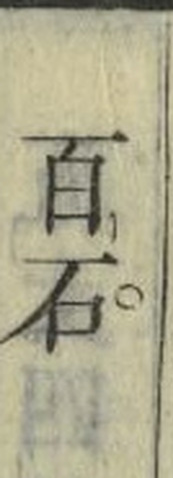百-石。
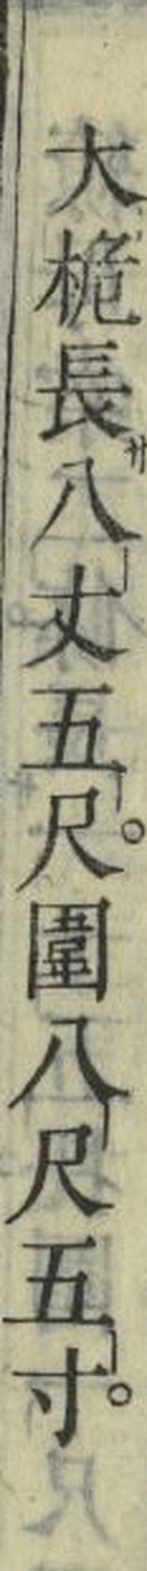大-桅長八-丈五-尺。圍八-尺五-寸。
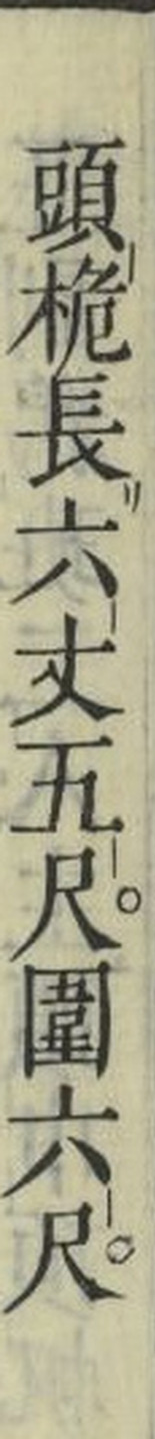頭-桅長六-丈五-尺。圍六-尺。
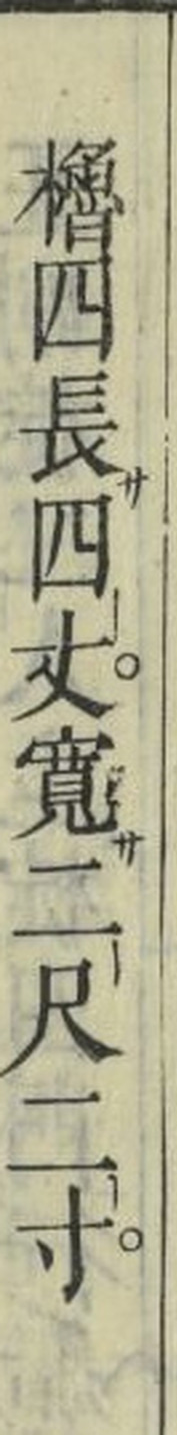櫓四長四-丈。寬二-尺二-寸。
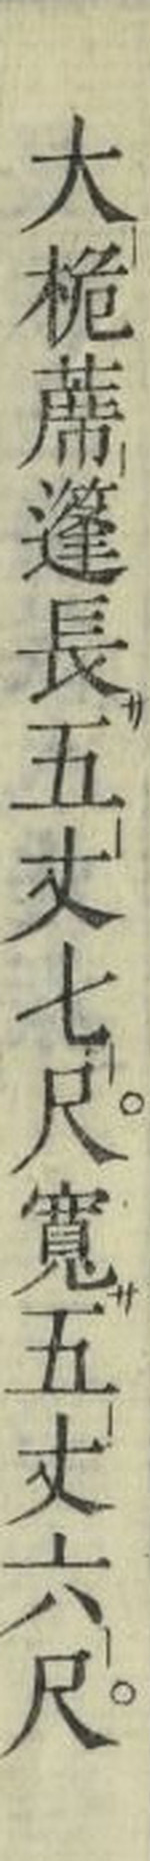大-桅蓆-篷長五-丈七-尺。寬五-丈六-尺。
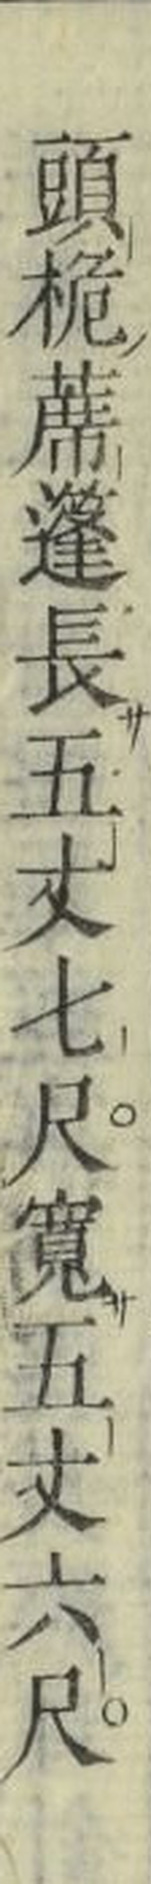頭-桅蓆-篷長五-丈七-尺。寬五-丈六-尺。
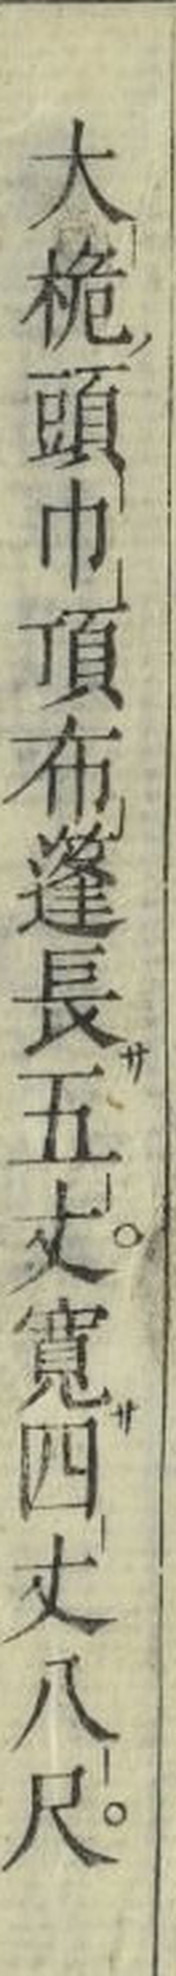大-桅頭-巾-頂布-篷長五-丈。寬四-丈八-尺。
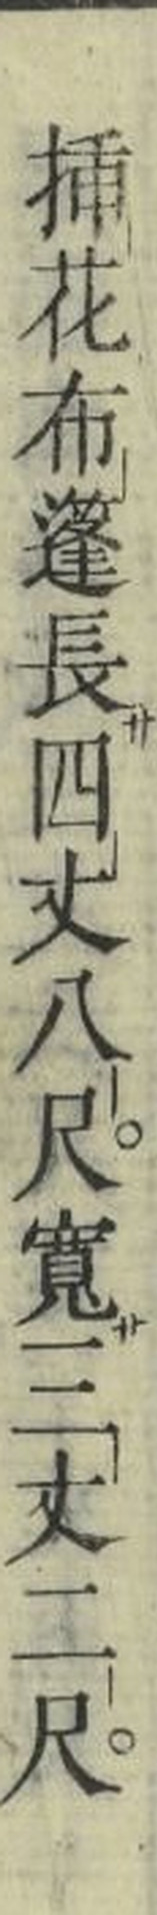挿-花布-篷長四-丈八-尺。寬三-丈二-尺。
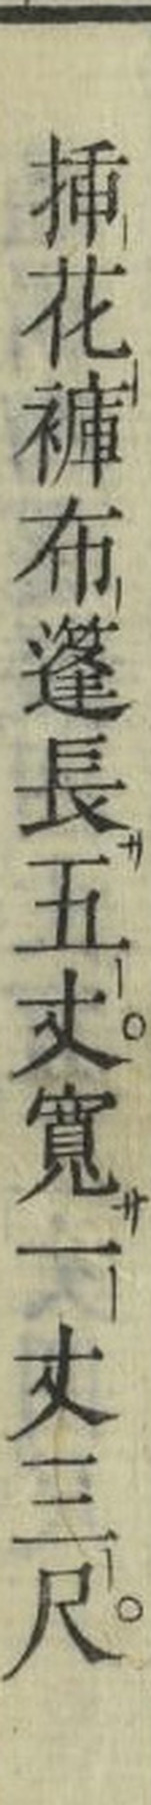挿-花-褲布-篷長五-丈。寬一-丈三-尺。

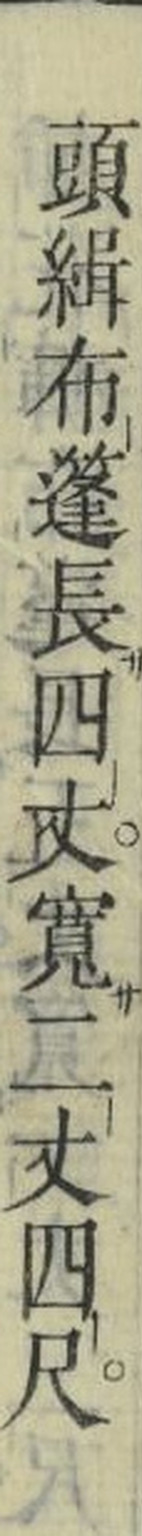頭-緝布-篷長四-丈。寬二-丈四-尺。
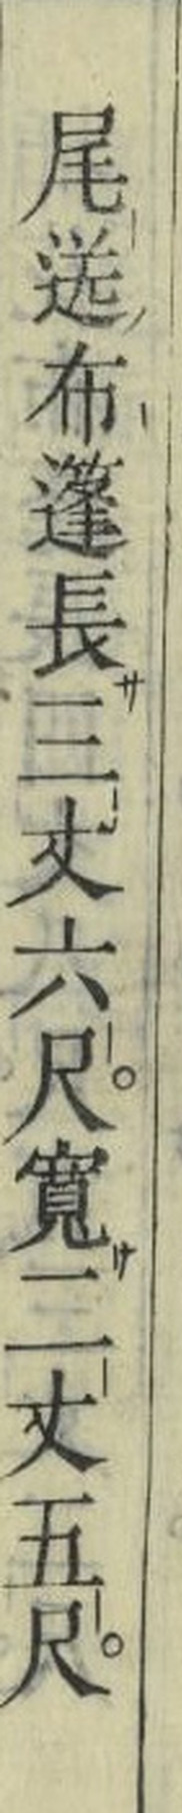尾-送布-篷長三-丈六-尺。寬二-丈五-尺。
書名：中山伝信録 巻一
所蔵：University of the Ryukyus Library
